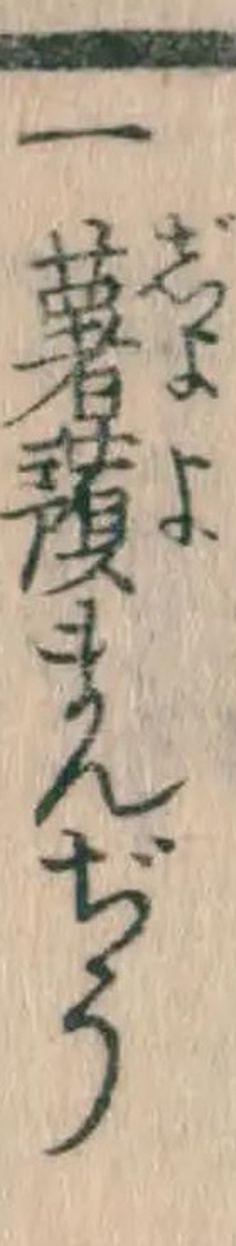一薯蕷まんぢう
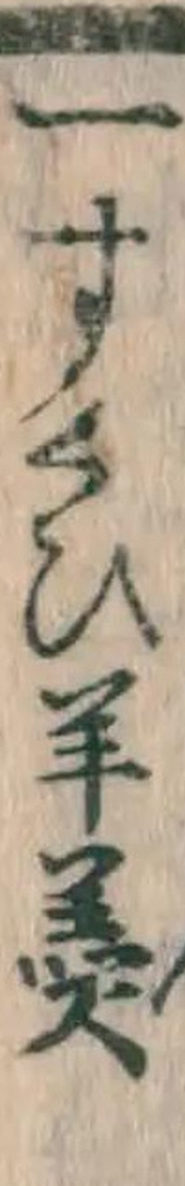一すくひ羊羹
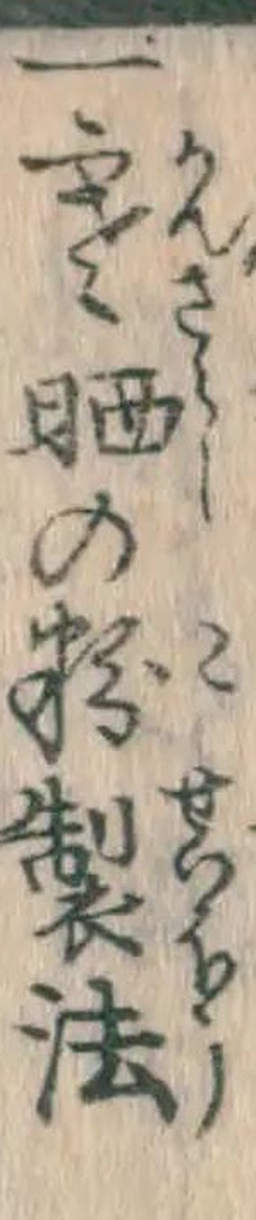一寒晒の粉製法
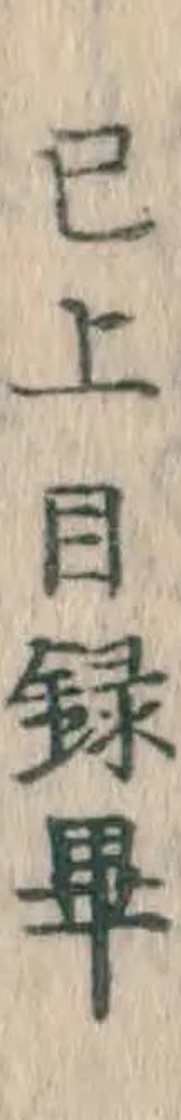已上目録畢
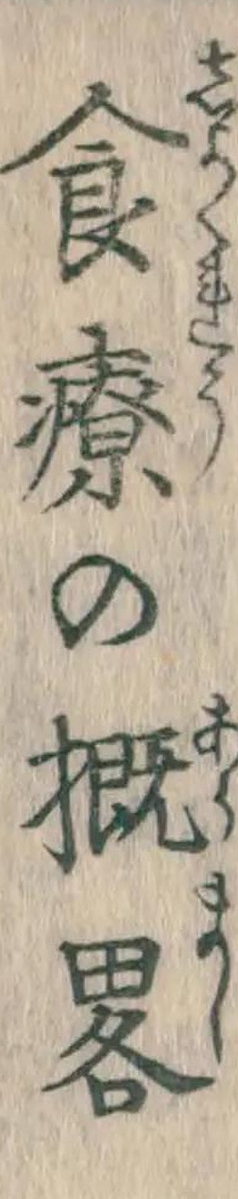食療の概略
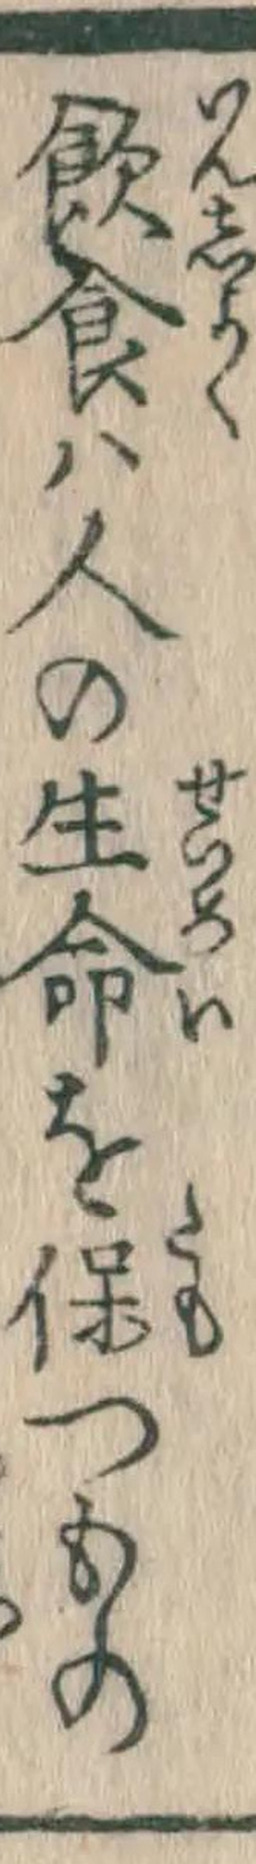飲食は人の生命を保つもの
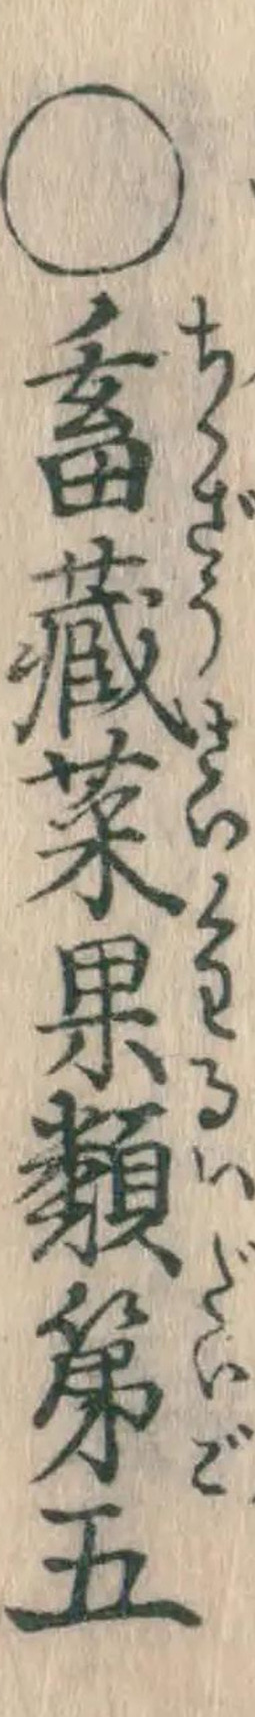○畜蔵菜果類第五
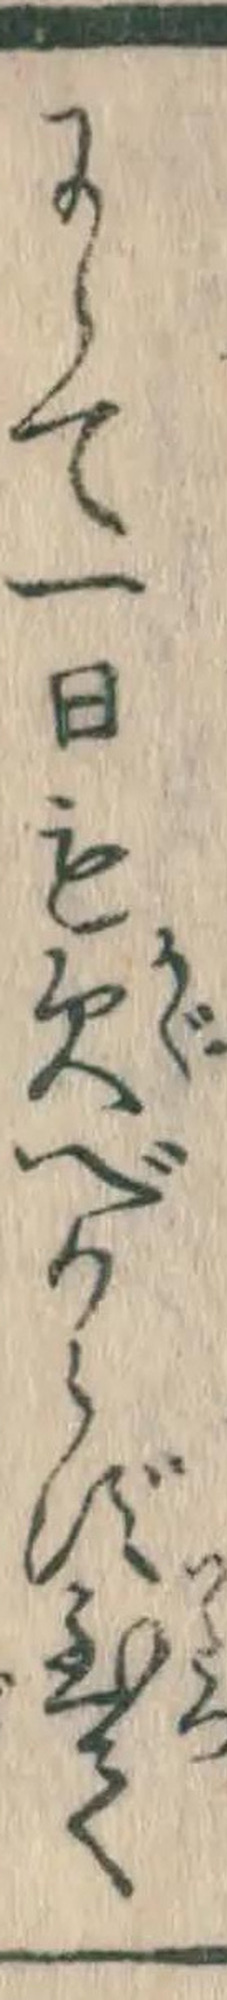にして一日も欠べからず至て
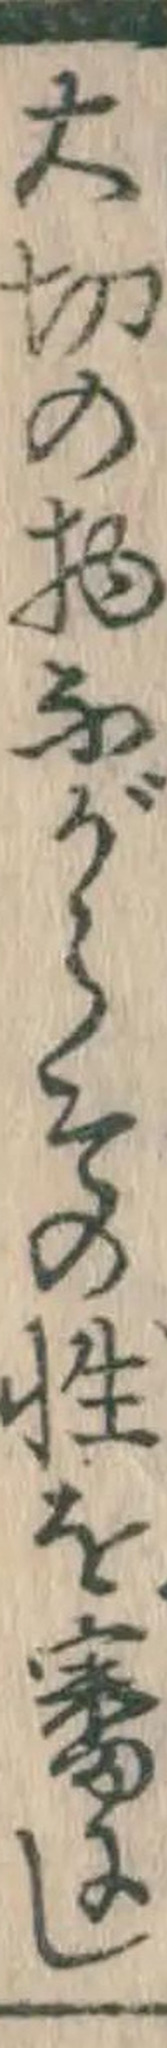大切の物ながらその性を審にし
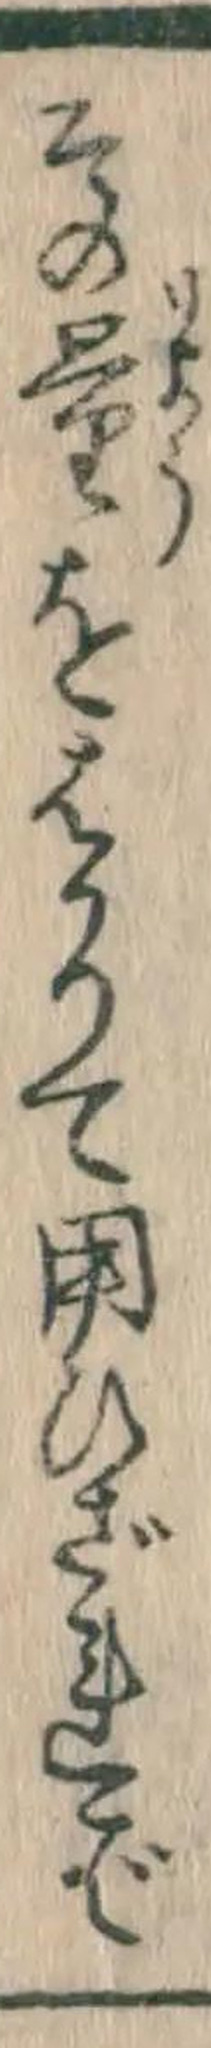その量をはかりて用ひざれば
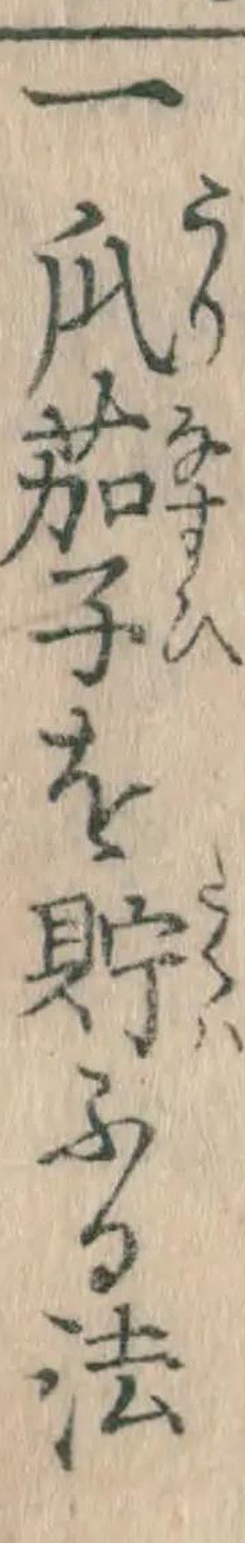一瓜茄子を貯ふる法

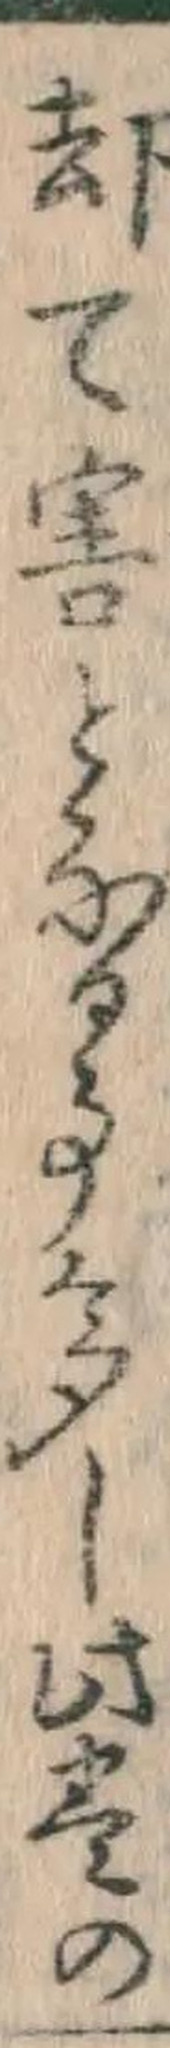却て害となる事多し此巻の
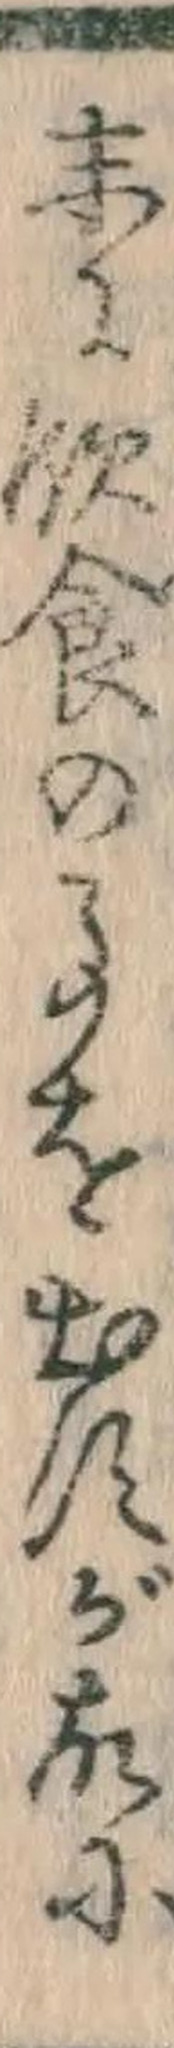末に飲食の事を出すが故に
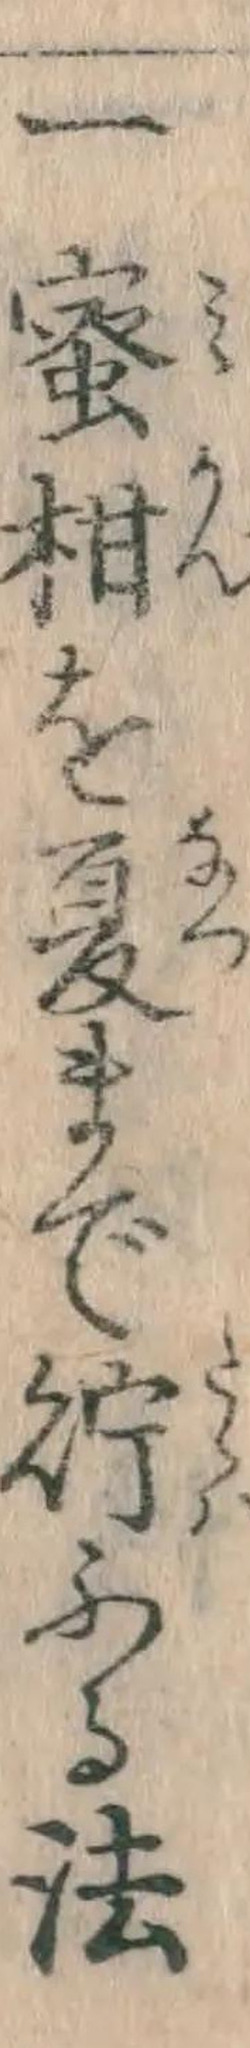一蜜柑を夏まで貯ふる法
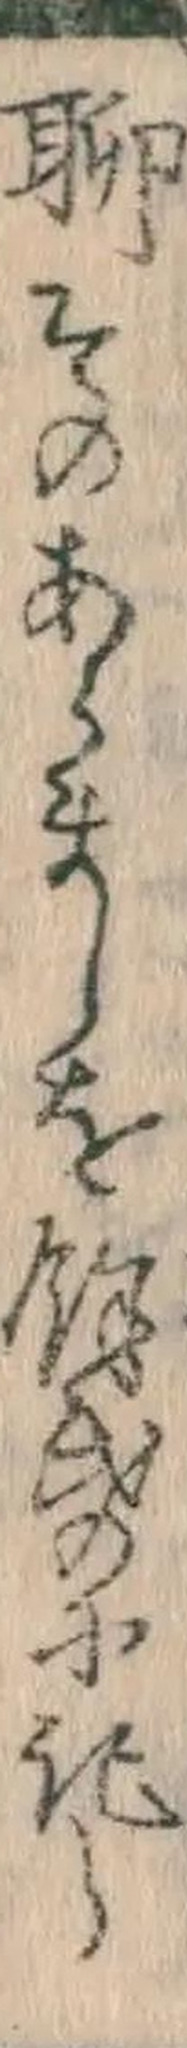聊そのあらましを余紙に記し
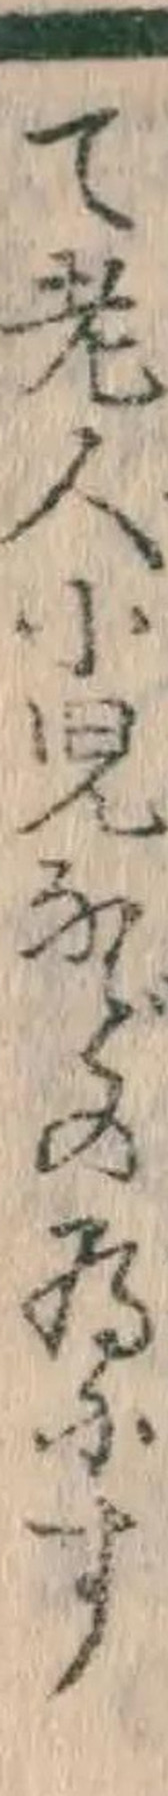て老人小児などの為にす
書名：広益秘事大全 3巻. [1]
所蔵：国立国会図書館 National Diet Library, JAPAN
